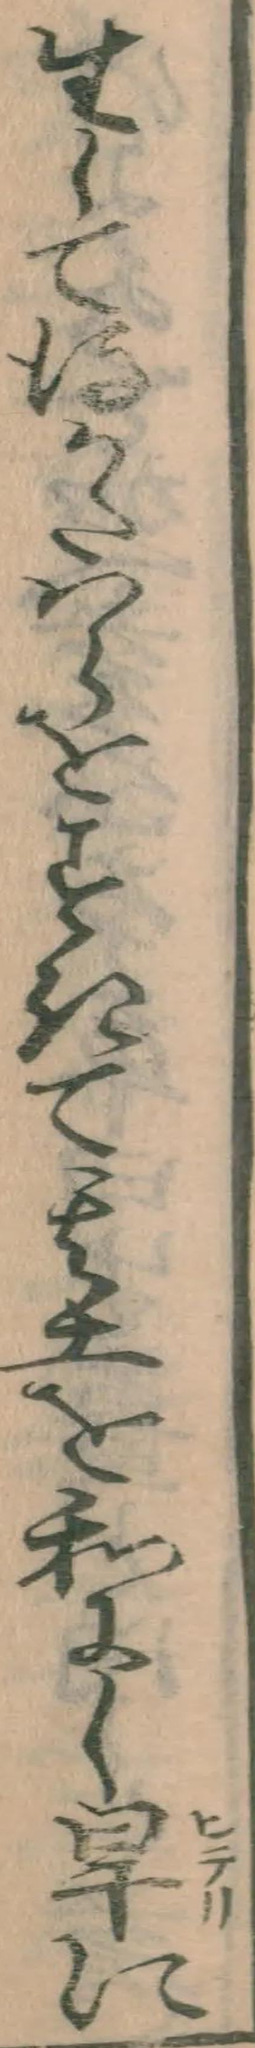生して後かたはらをすきて其土を和にして旱に
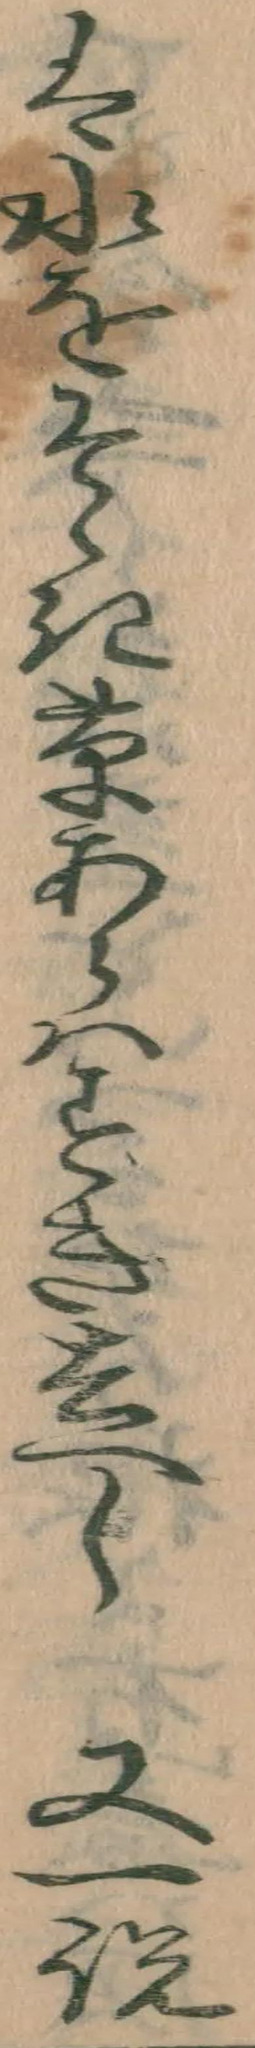は水をそゝき草あらはすき去へし又一説
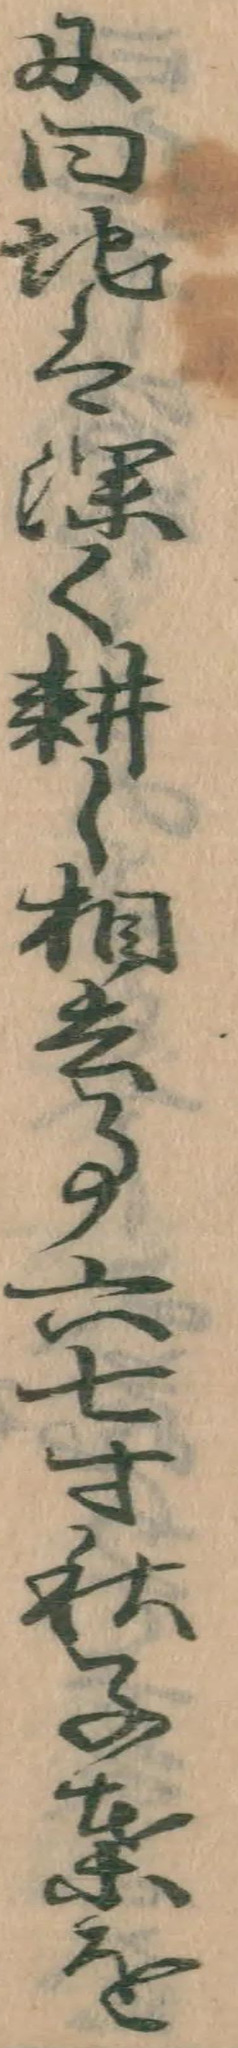に曰地は深く耕し相去事六七寸秋子葉を
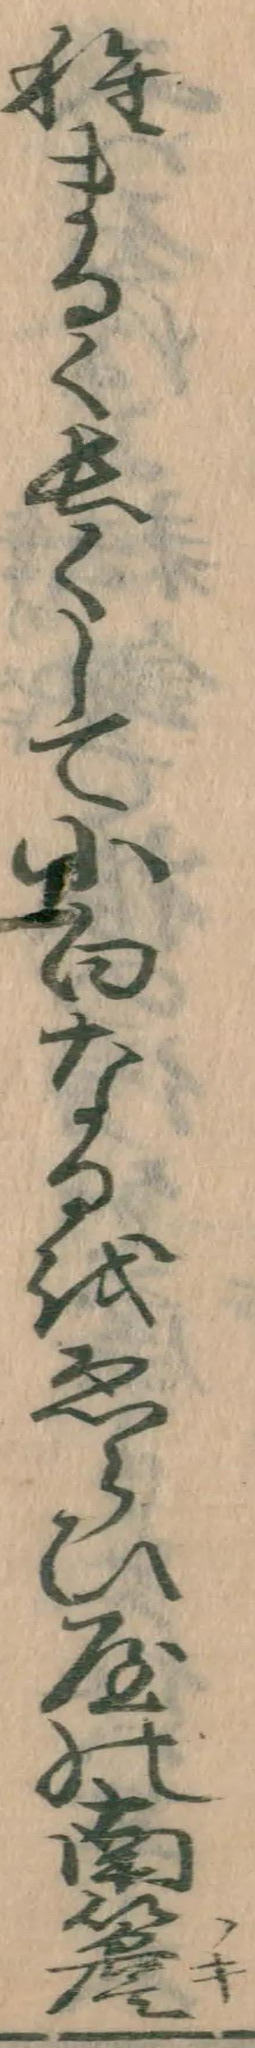種まるく長くして小白なるをゑらひ屋の南簷
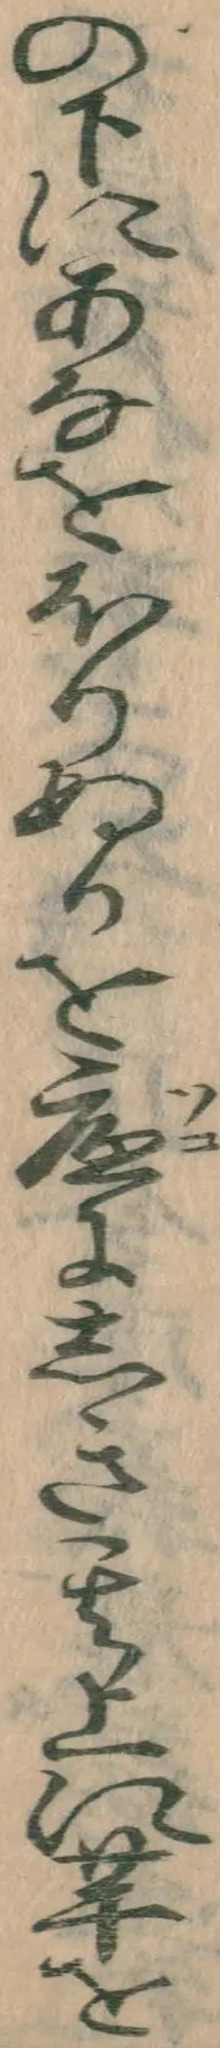の下にあなをほりぬかを底にしき其上に芋を
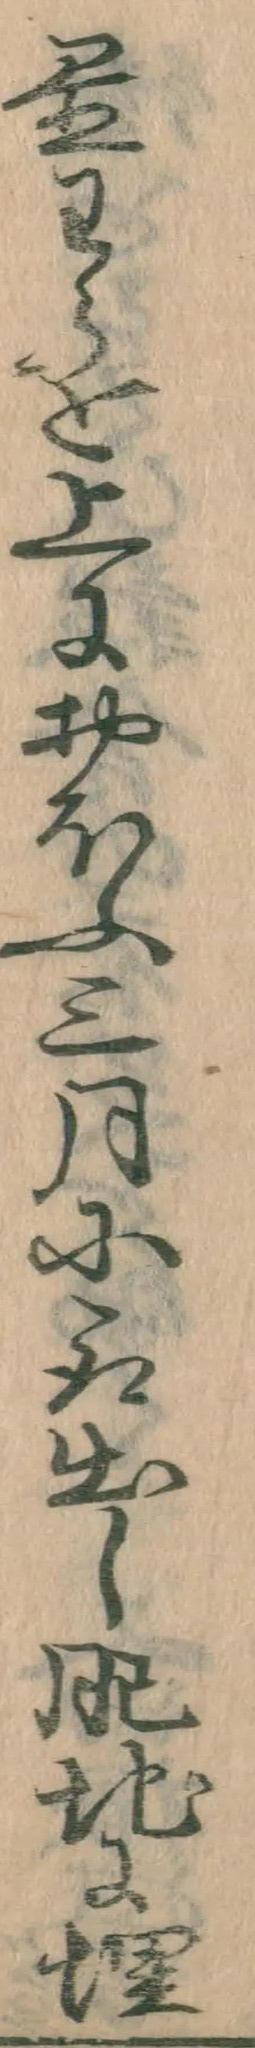置わらを上におほふ三月に取出し肥地に埋
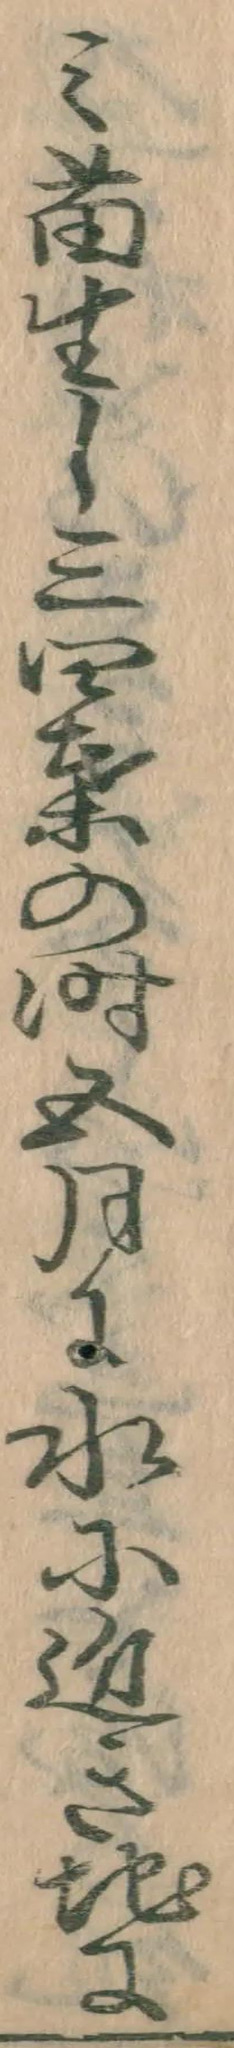之苗生し三四葉の時五月に水に近き地に
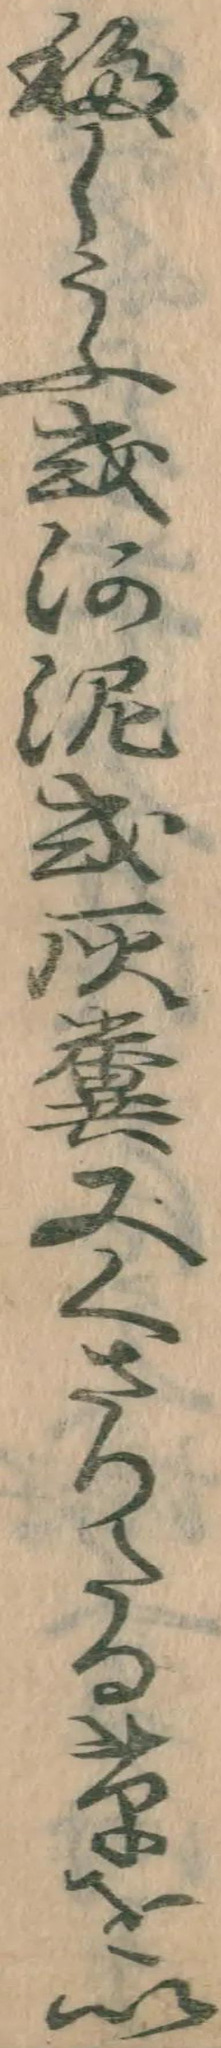移しうふ或河泥或灰糞又くさりたる草を以

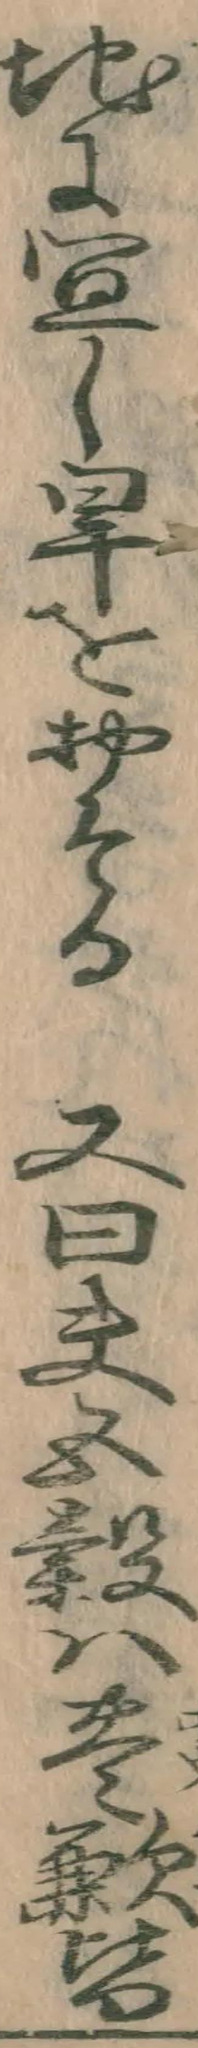地に宜し旱をおそる又曰夫五穀は豊歉皆
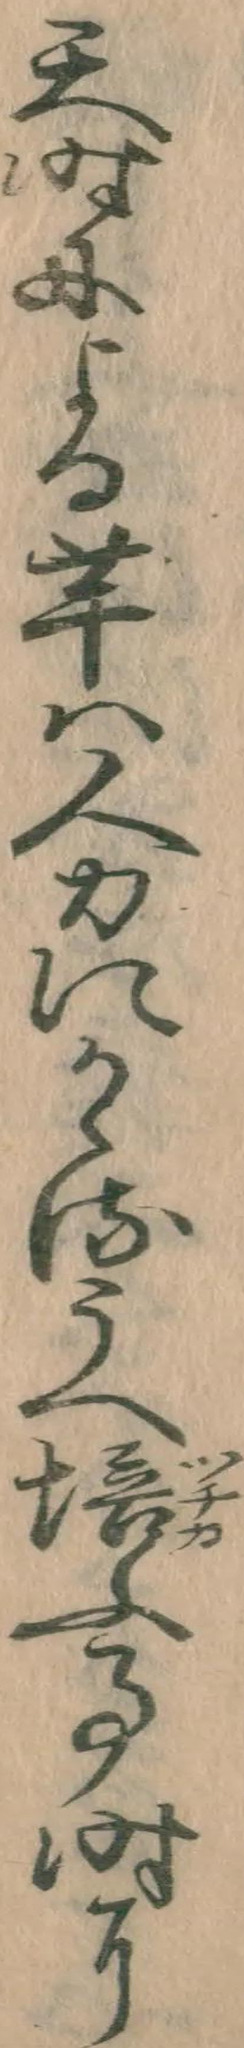天時による芋は人力にかゝるうへ培ふ事時に
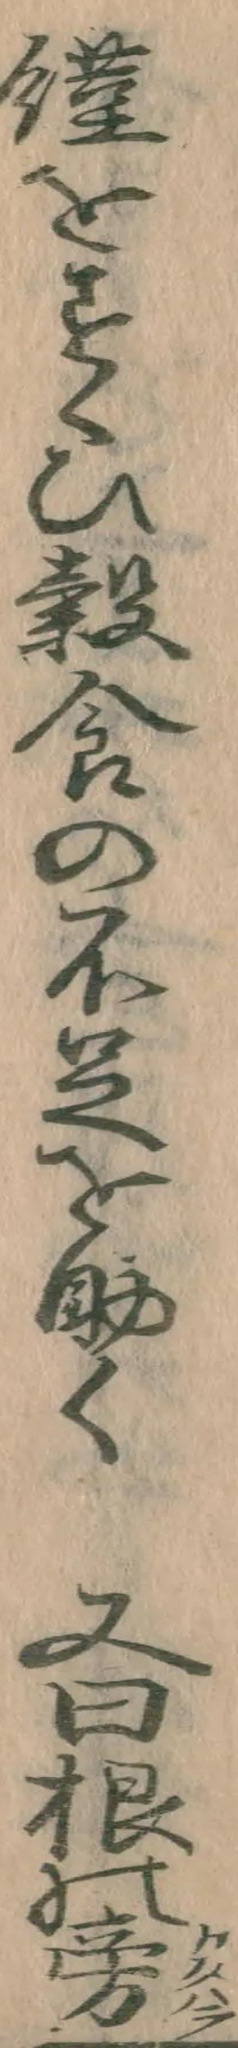饉をすくひ穀食の不足を助く又曰根の旁
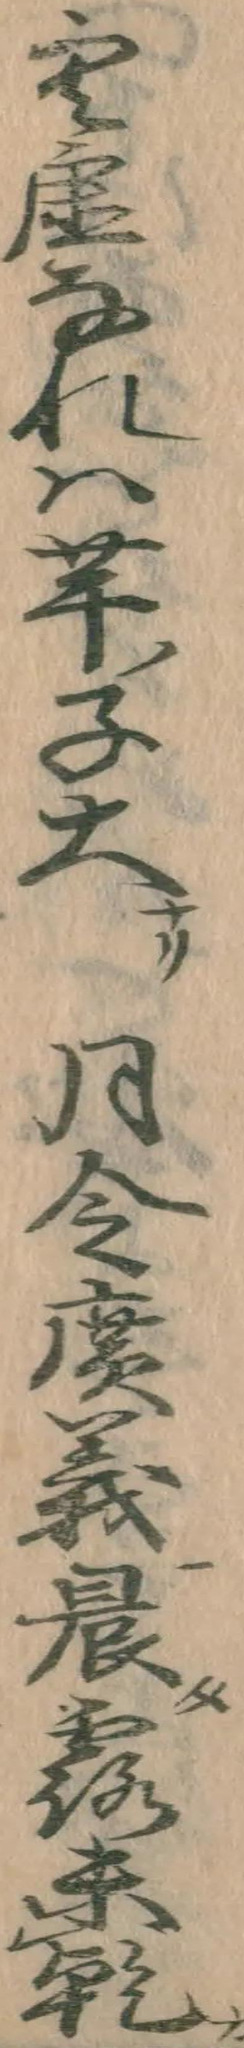空虚なれは芋子大月令広義晨露未乾
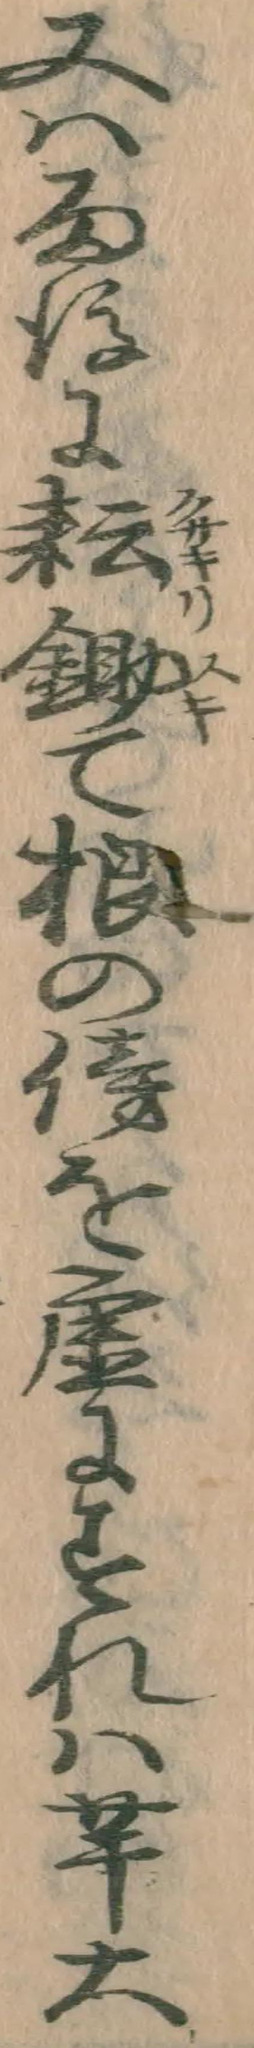又は雨後に耘鋤て根の傍を虚にすれは芋大
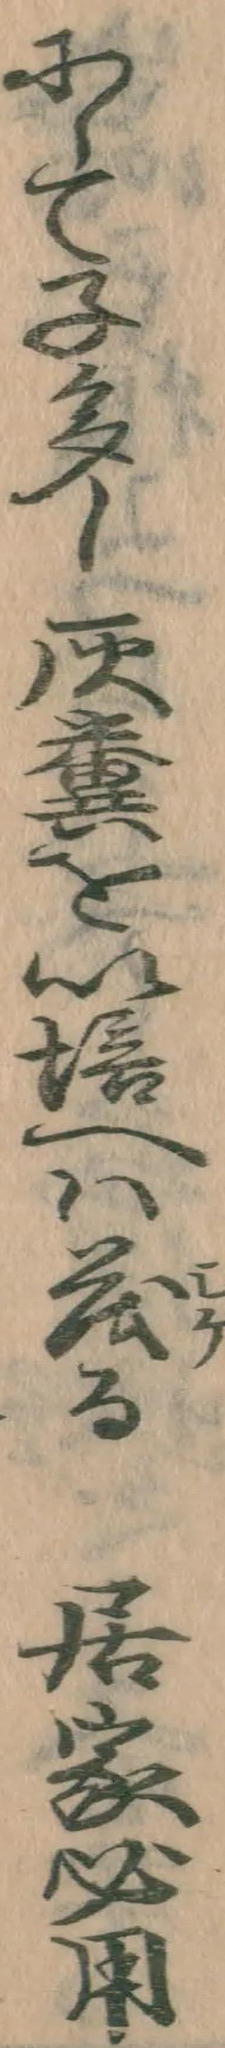にして子多し灰糞を以培へは茂る居家必用
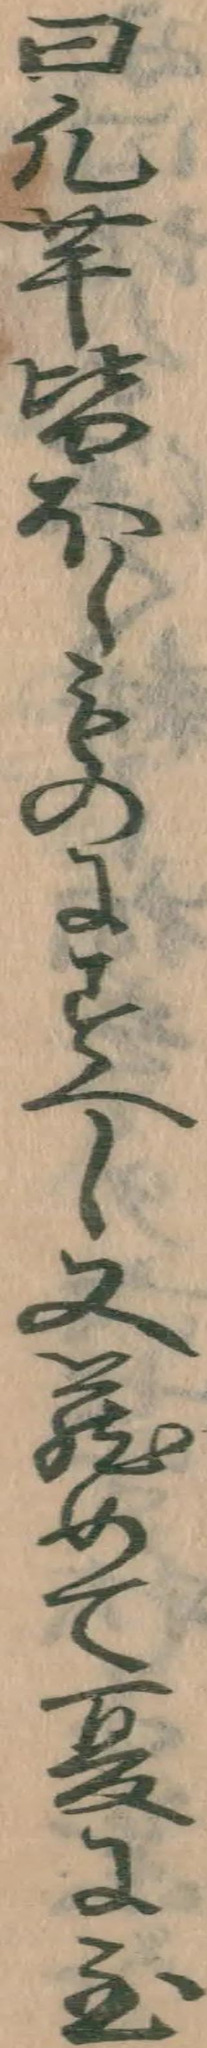曰凡芋皆ほしものにすへし又蔵めて夏に至
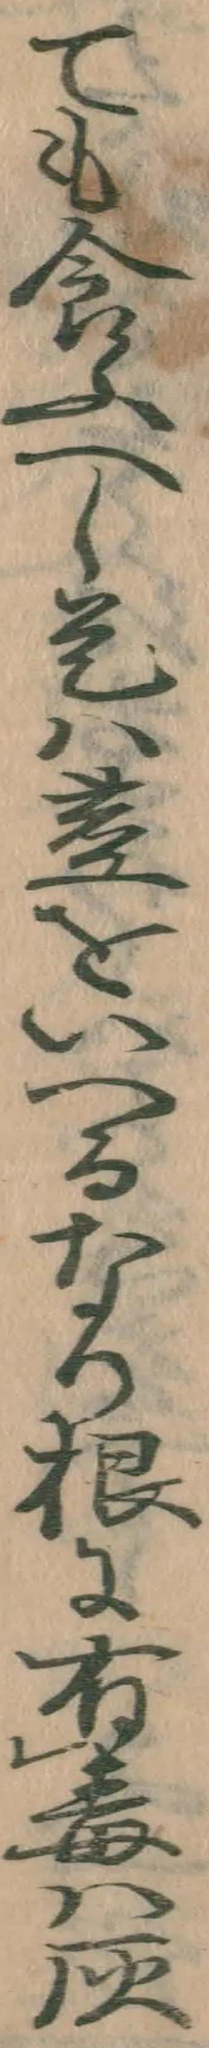ても食ふへし是は茎をいへるなり根に有毒は灰
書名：菜譜 3巻
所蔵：国立国会図書館 National Diet Library, JAPAN
